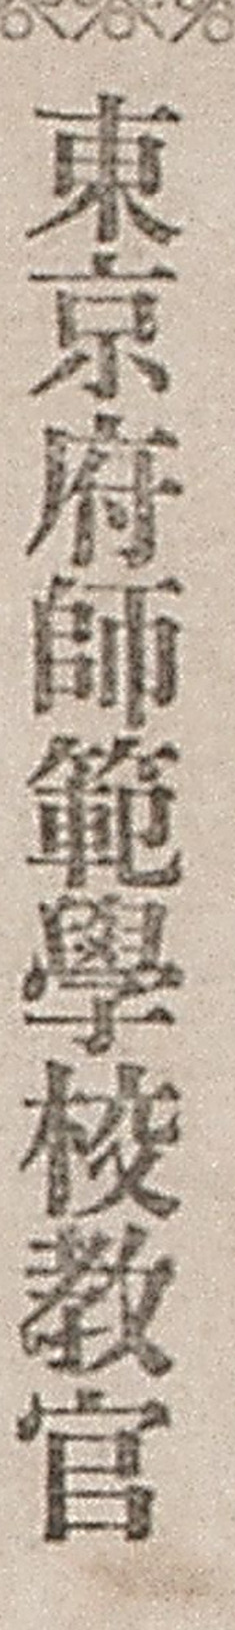東京府師範学校教官
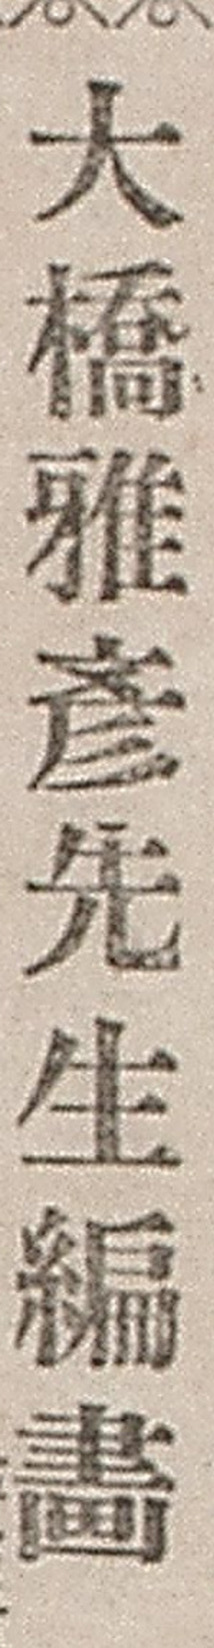大橋雅彦先生編畫
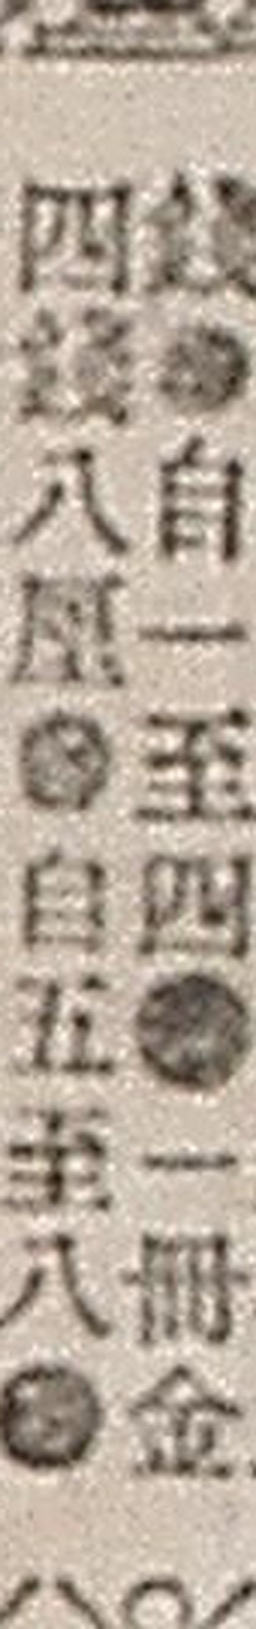四銭八厘●自五至八●
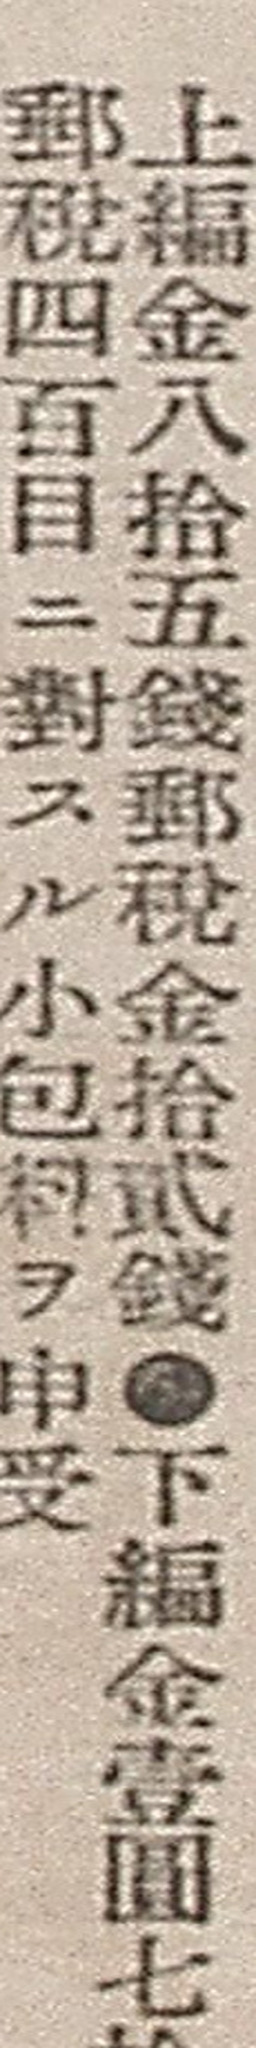郵税四百目二対する小包料ヲ申受
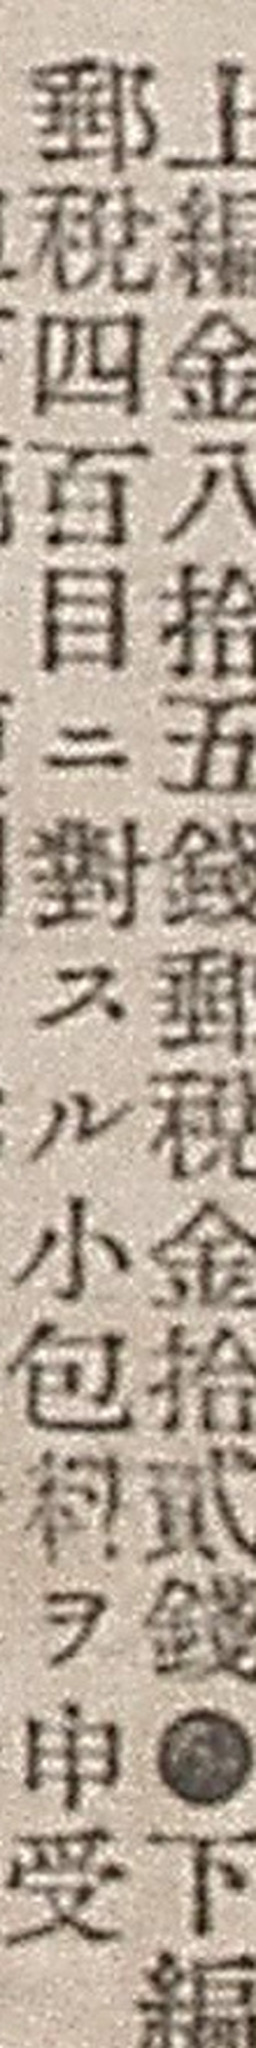郵税四百目二対する小包料ヲ申受
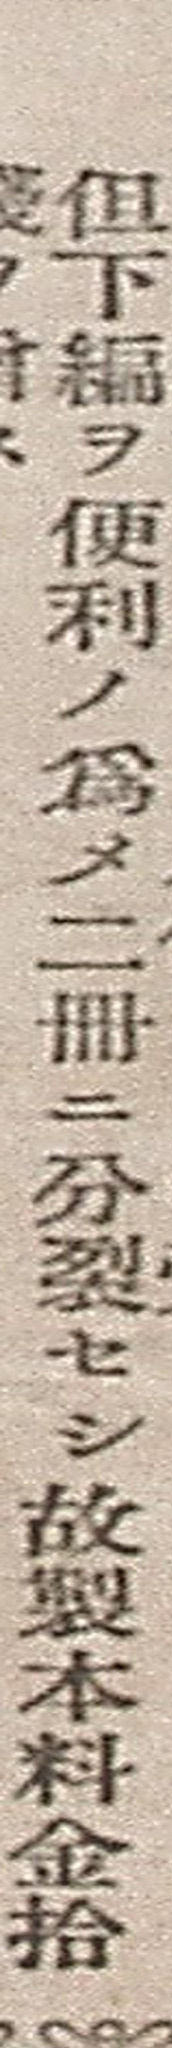但下編ヲ便利ノ為二冊二分裂せし故製本料金拾
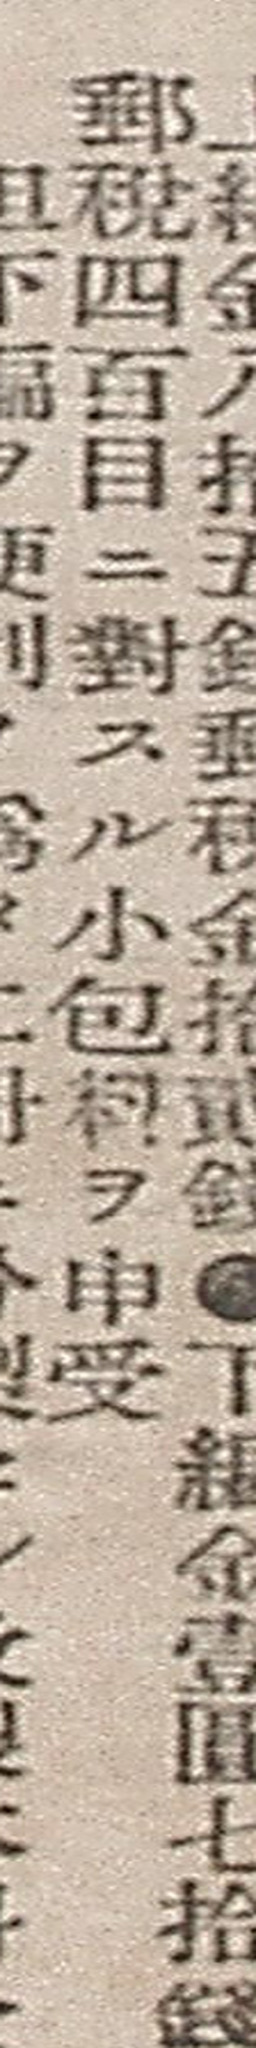郵税四百目二対する小包料ヲ申受
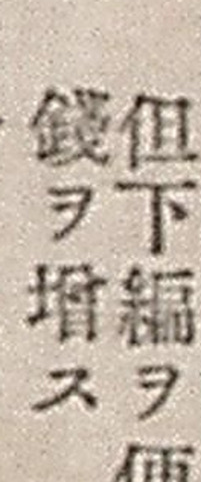銭ヲ増ス
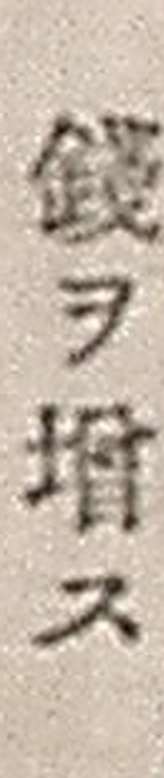銭ヲ増ス
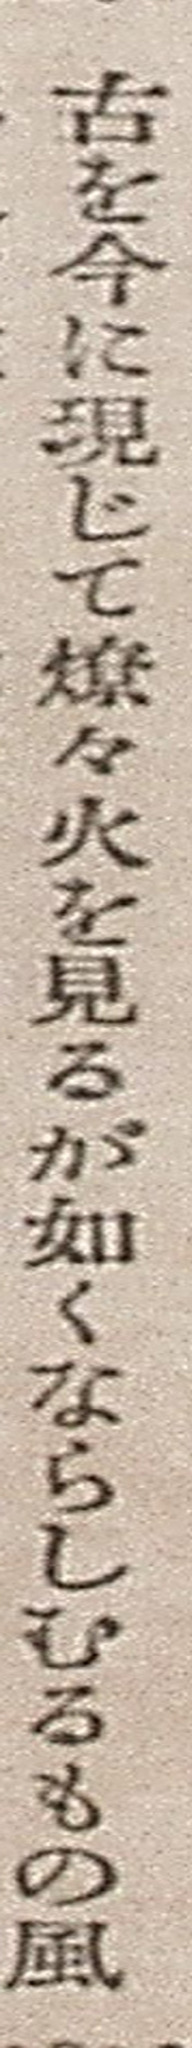古を今に現じて稜々火を見るが如くなならしむるもの風
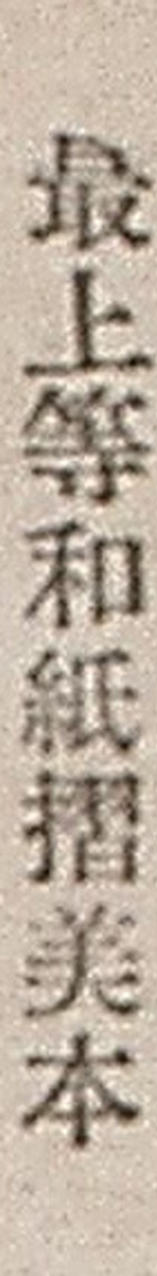最上等和紙摺り美本
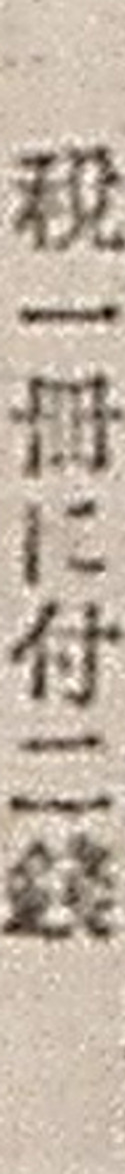税一冊に付二銭
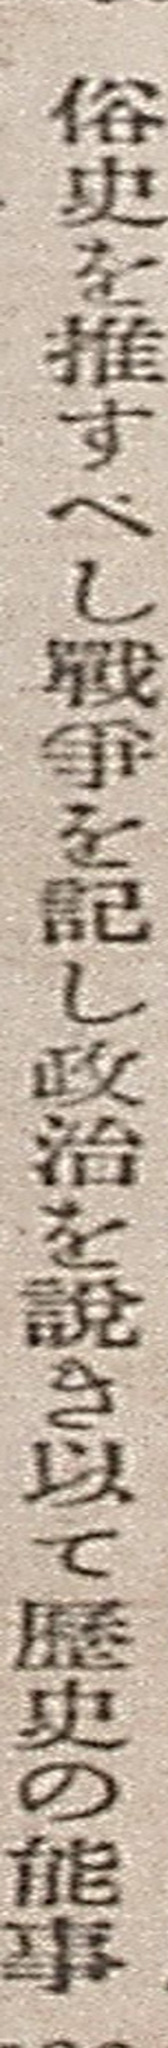俗史を推すべし戦争を記し政治を説き以て歴史の能事
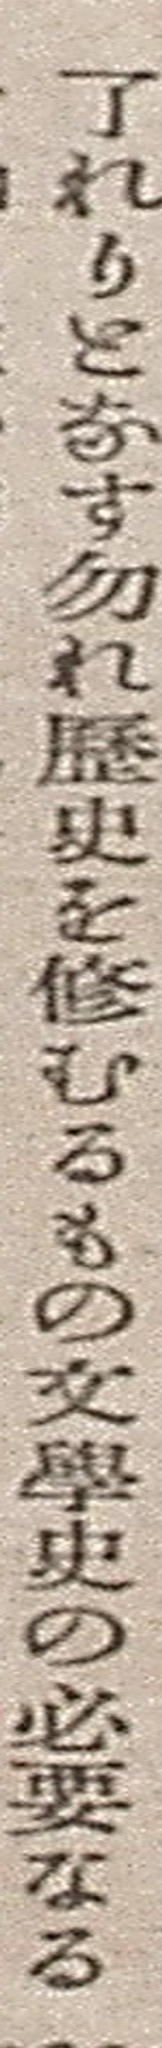了れりとなす勿れ歴史を修むるもの文学史の必要なる
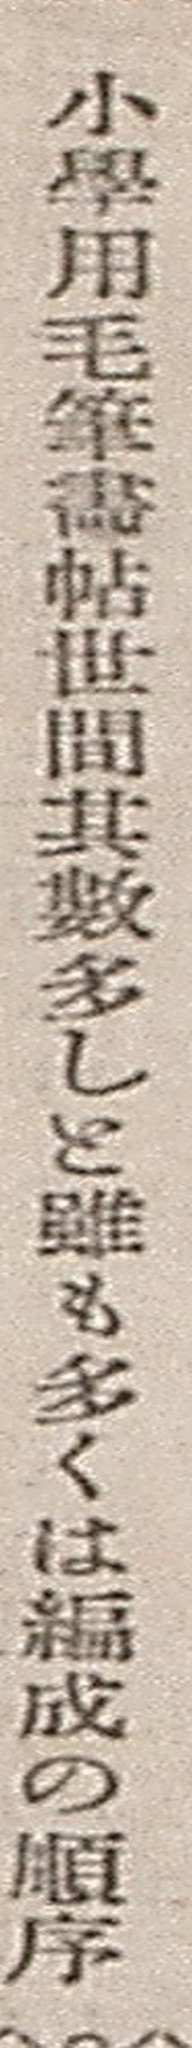小学用毛筆畫帖世間其数多しと雖も多くは編成の順序
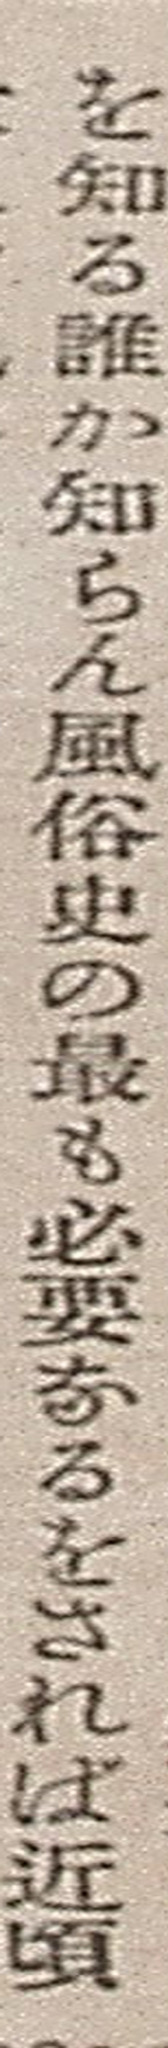を知る誰か知らん風俗史の最も必要なるをされば近頃
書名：風俗畫報臨時増刊第百二十六號　洪水被害録（中）
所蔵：東京大学地震研究所図書室 Earthquake Research Institute Library, The University of Tokyo, JAPAN
